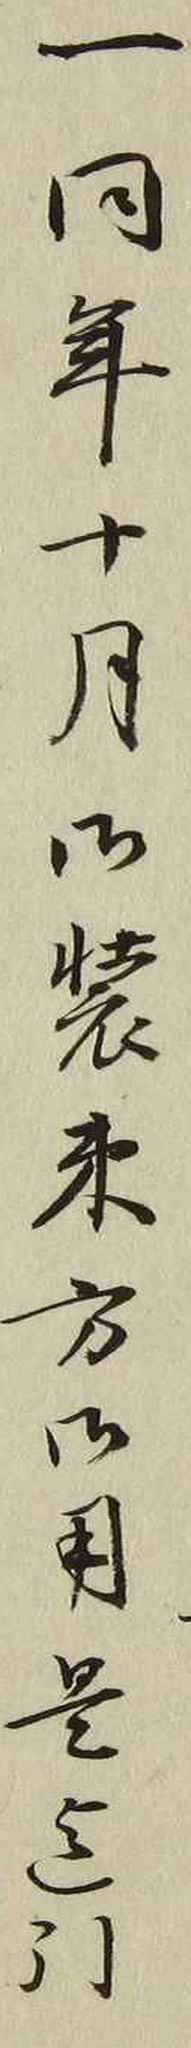一同年十月御装束方御用是迄引き
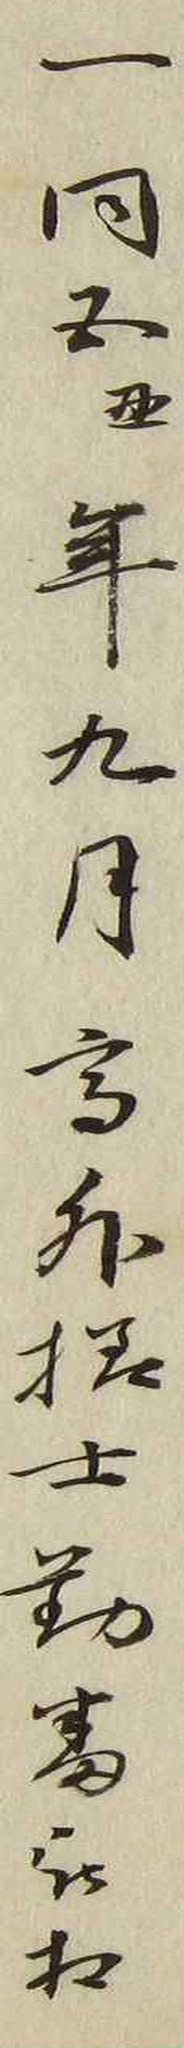一同五丑年九月高外様士勤番相

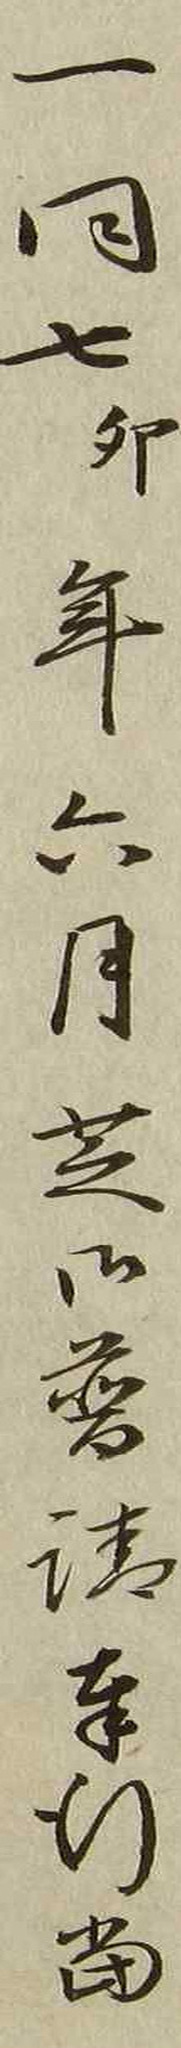一同七卯年六月芝ごふ御普請奉行当
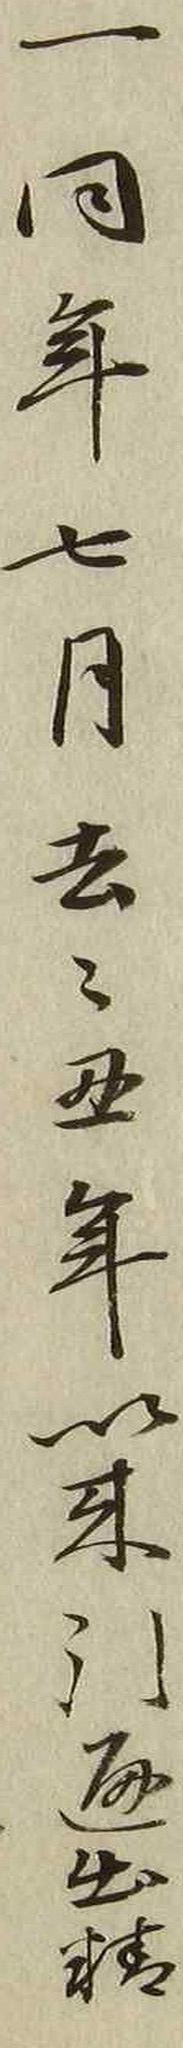一同年七月去々丑年以来引き通し出精
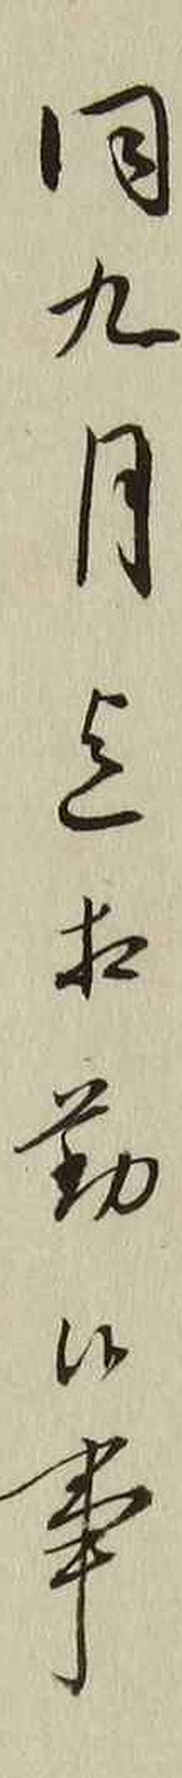同九月迄相勤め候事
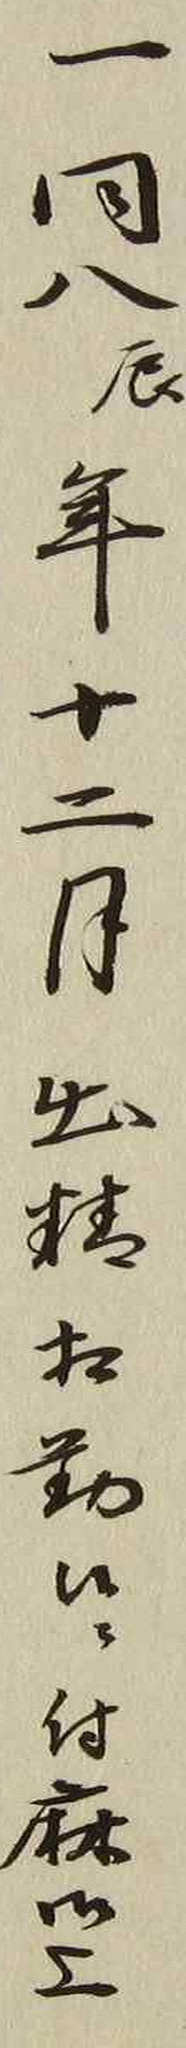一同八辰年十二月出精相勤め候ニ付麻御上
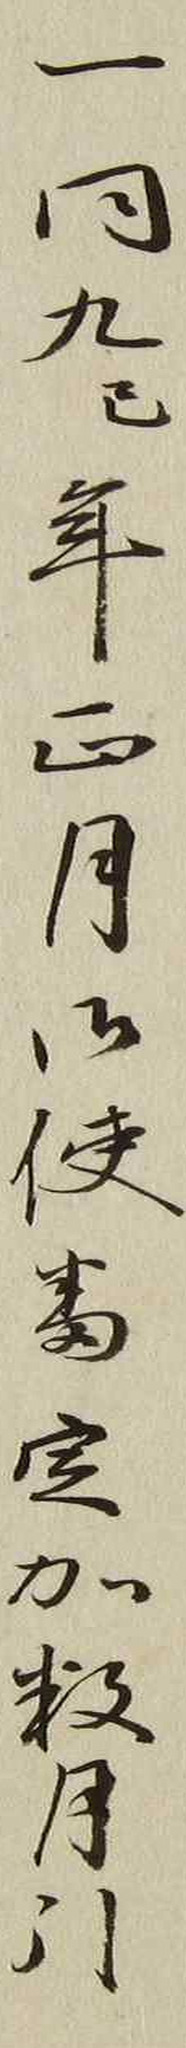一同九巳年正月御使い番定加数月引き
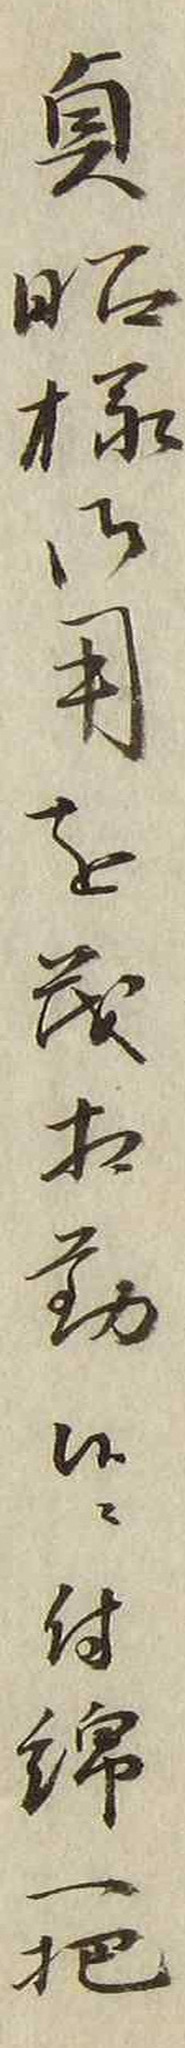貞昭様御用をも相勤め候ニ付き綿一把

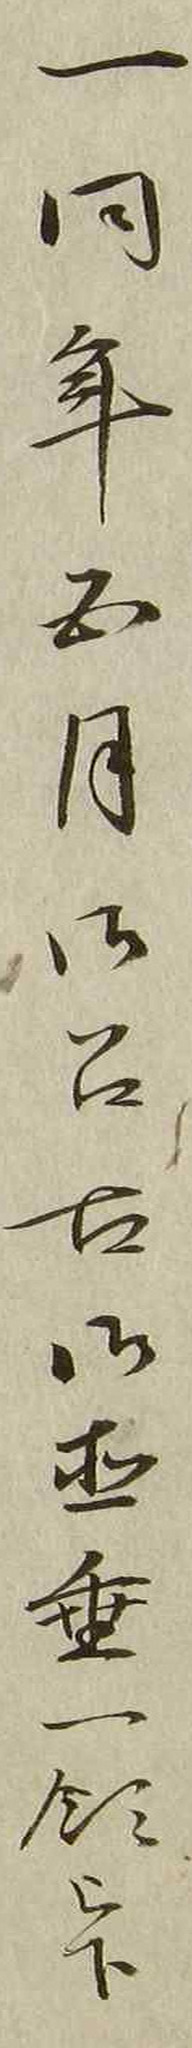一同年五月御召し古御直垂れ一領下し
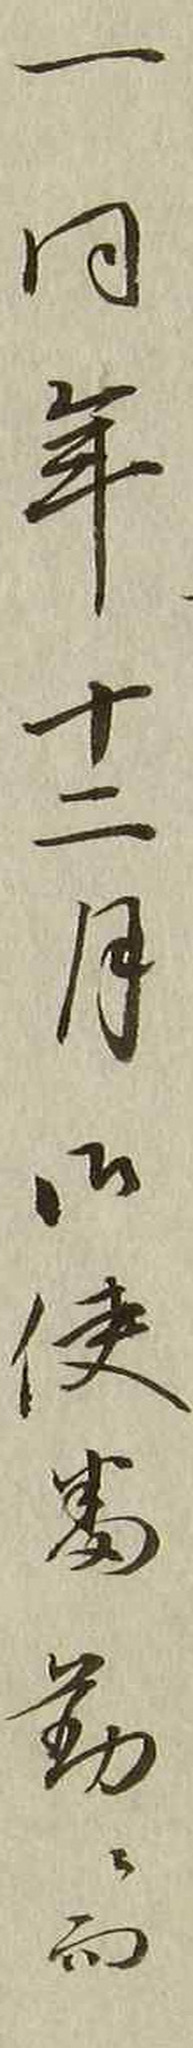一同年十二月御使い番勤めニて
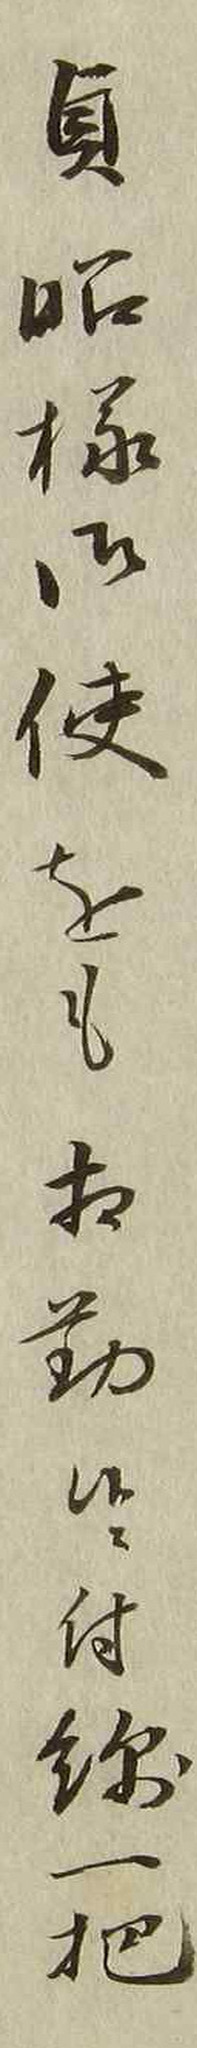貞昭様御使をも相勤め候ニ付き綿一把
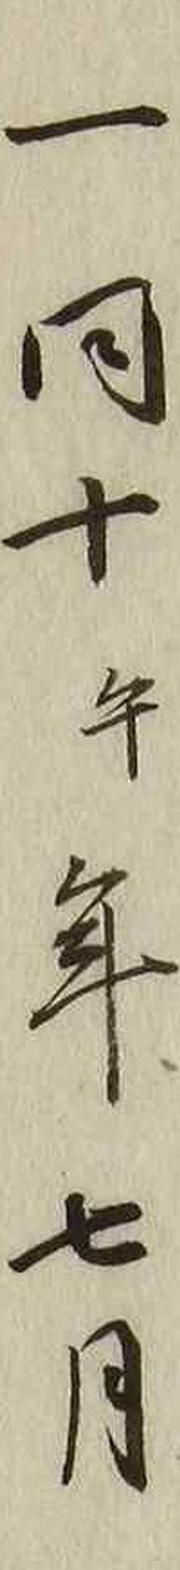一同十午年七月
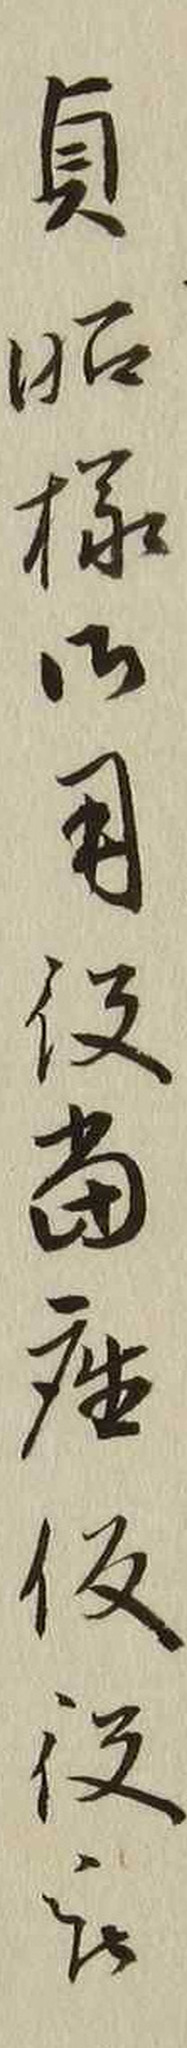貞昭様御用役当座仮役
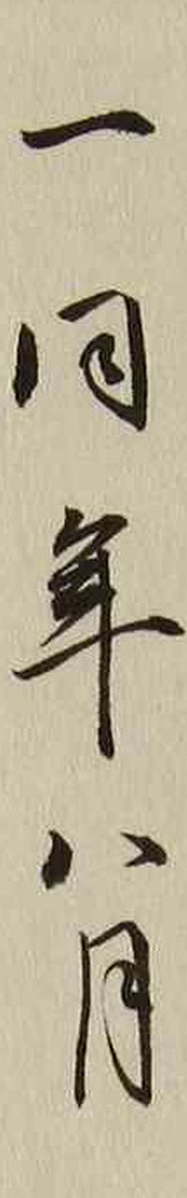一同年八月
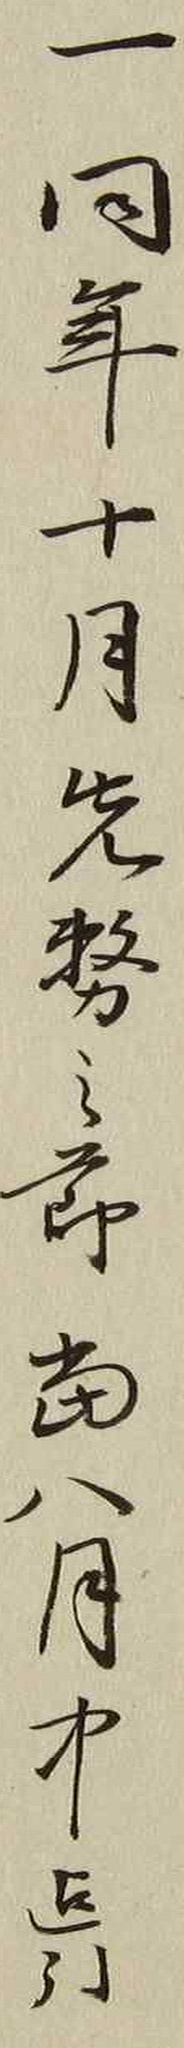一同年十月先務之節当八月中迄引
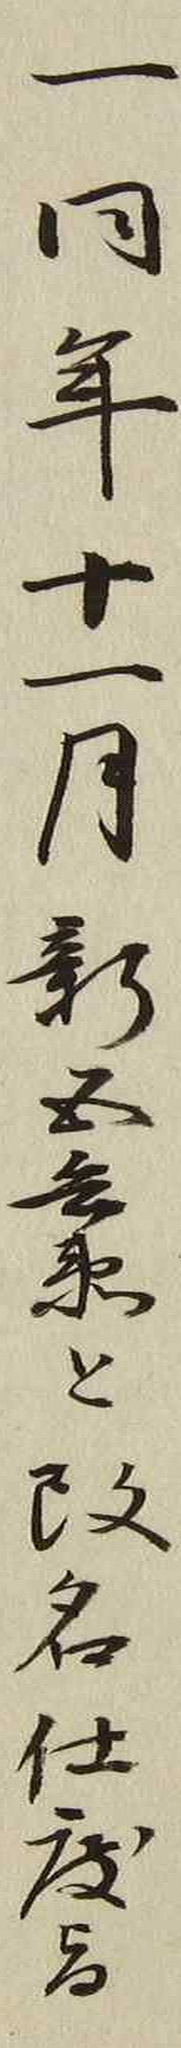一同年十一月新五兵衛と改名仕り度旨
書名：諸士系譜　巻之19　い之部19
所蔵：会津若松市立会津図書館
